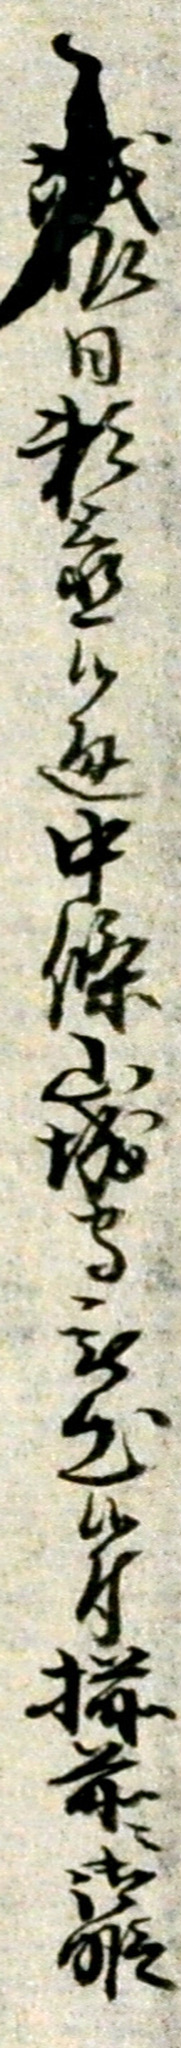城昨日頼置候通中條山城守罷出候付揃前ニ御暇
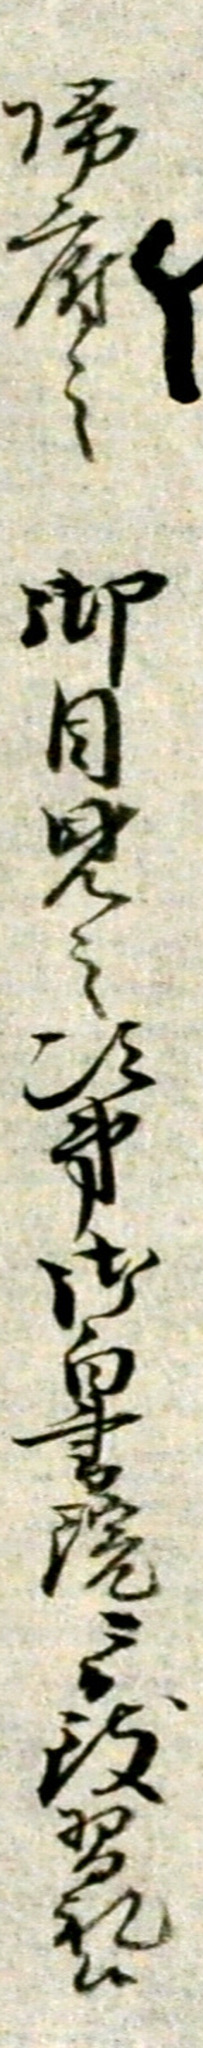帰府之御目見之次第御白書院ニ而致習礼候
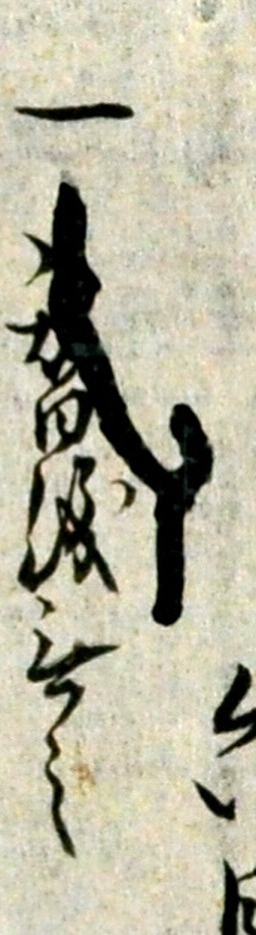一替儀無之
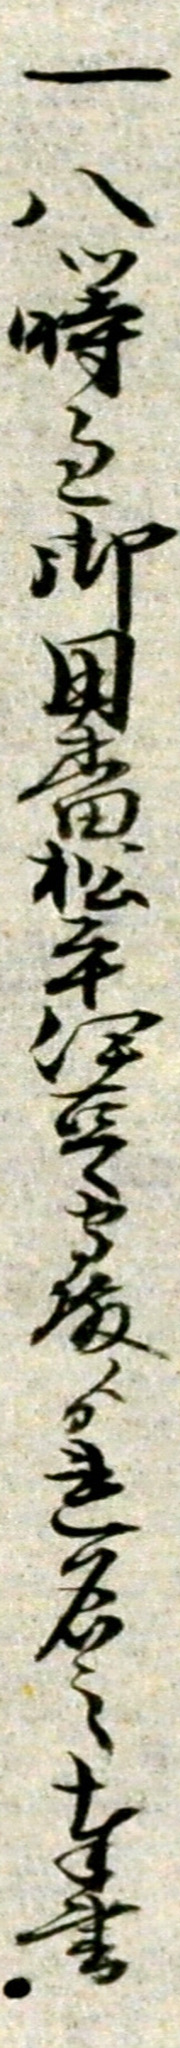一八ツ時過御用番松平伊豆守殿ゟ連名之奉書
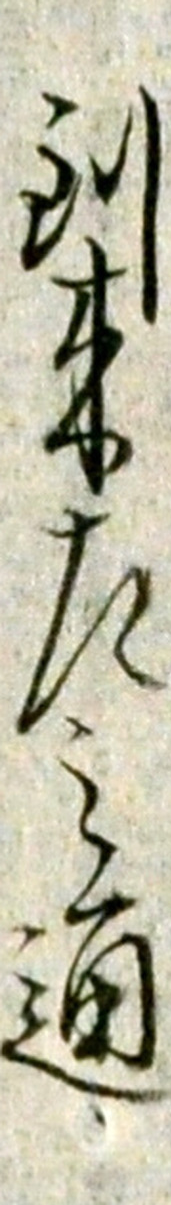到来左之通
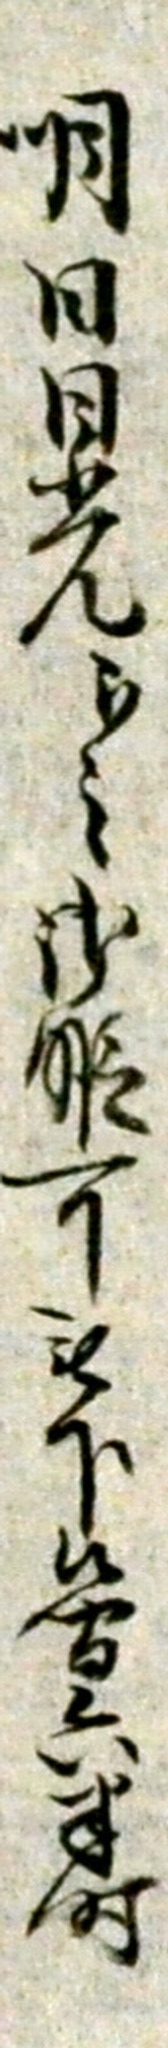明日日光江之御暇可被下候間六半時
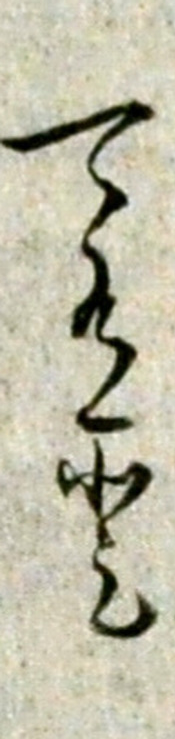可有登
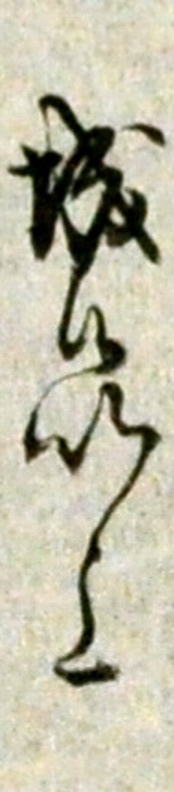城候以上
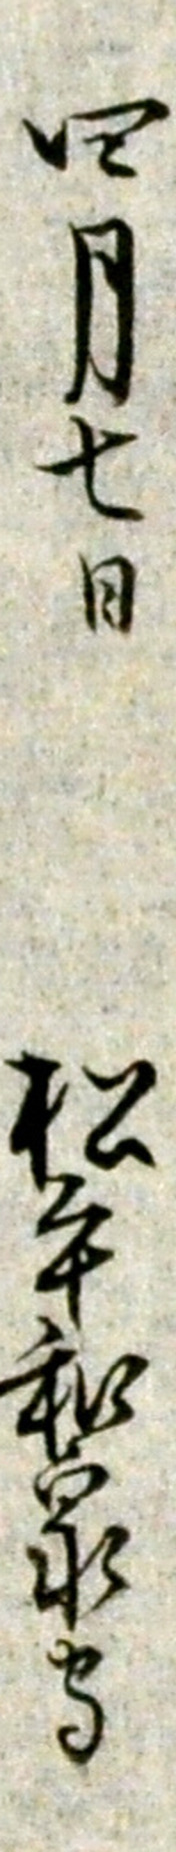四月七日松平和泉守
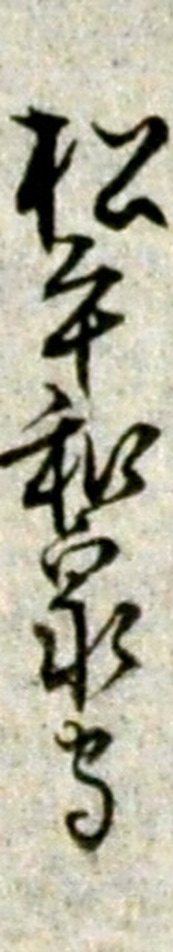松平伊豆守
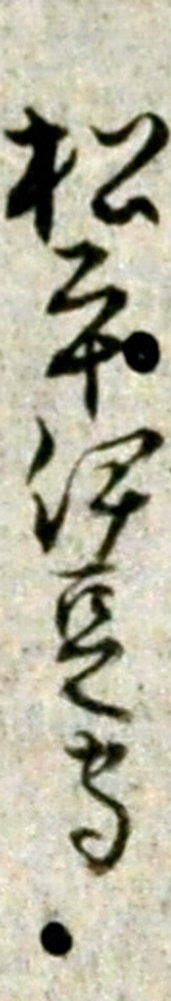松平伊豆守
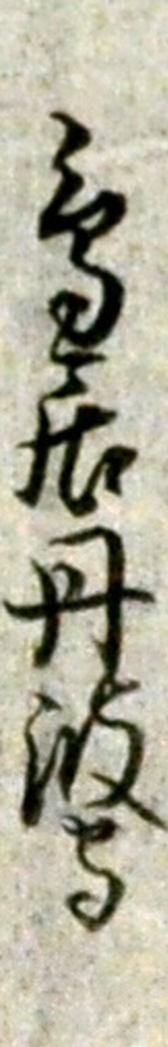鳥居丹波守
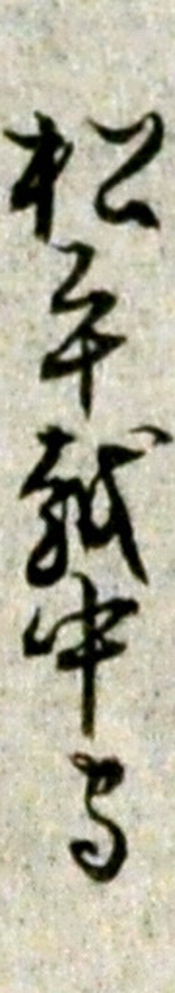松平越中守
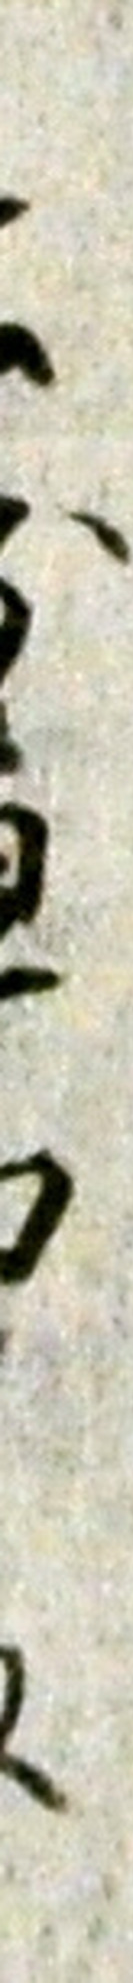土屋但馬守殿

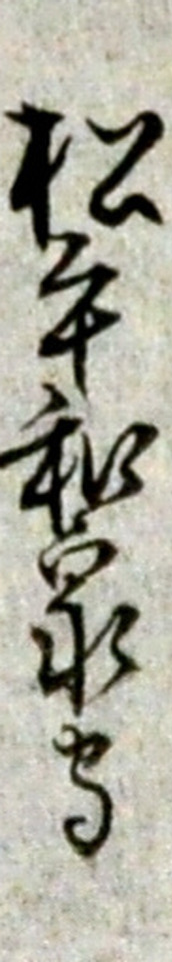松平伊豆守
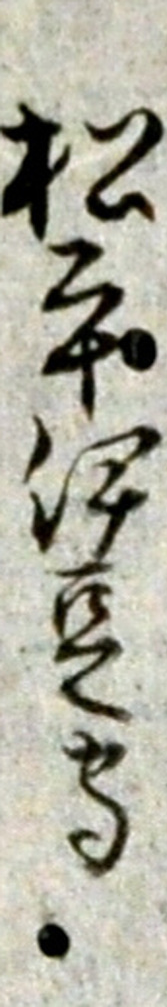松平伊豆守
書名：日光御名代相勤候節ノ留
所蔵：伊那市立高遠町図書館・合同会社AMANE
